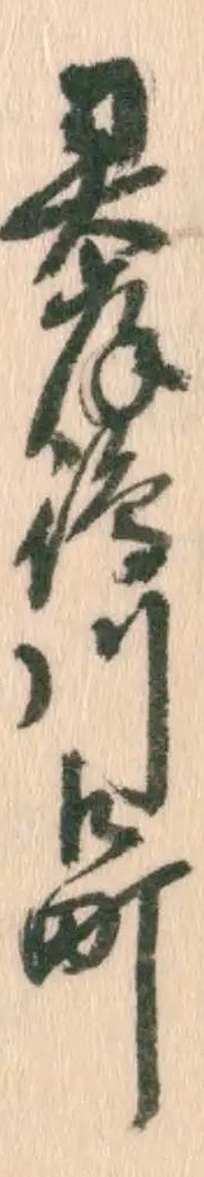霊岸嶋川口帳町
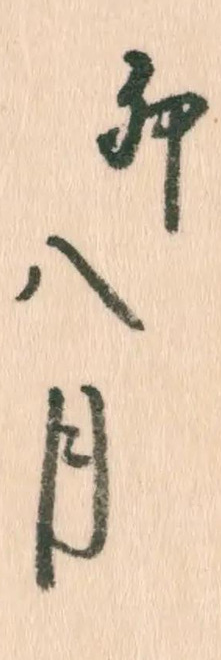卯八月

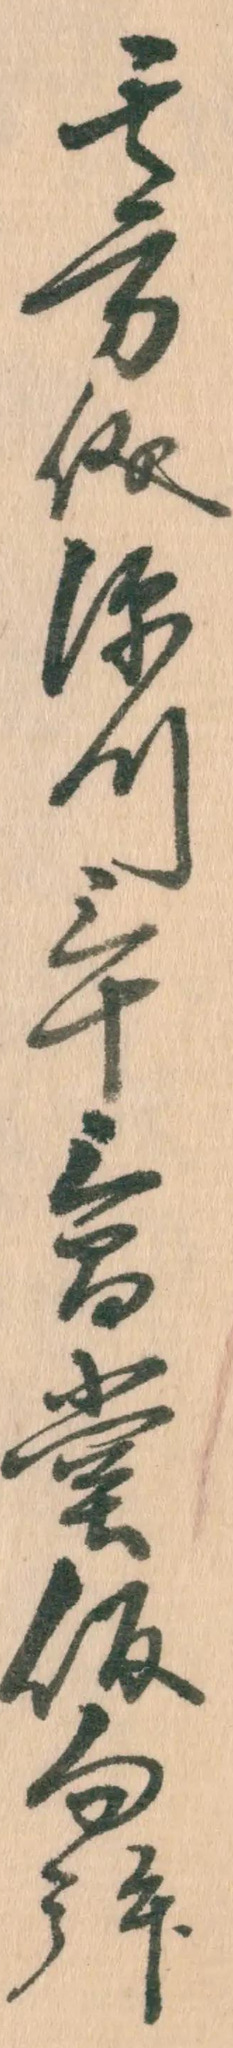其方儀深川三十三間堂仮向拝
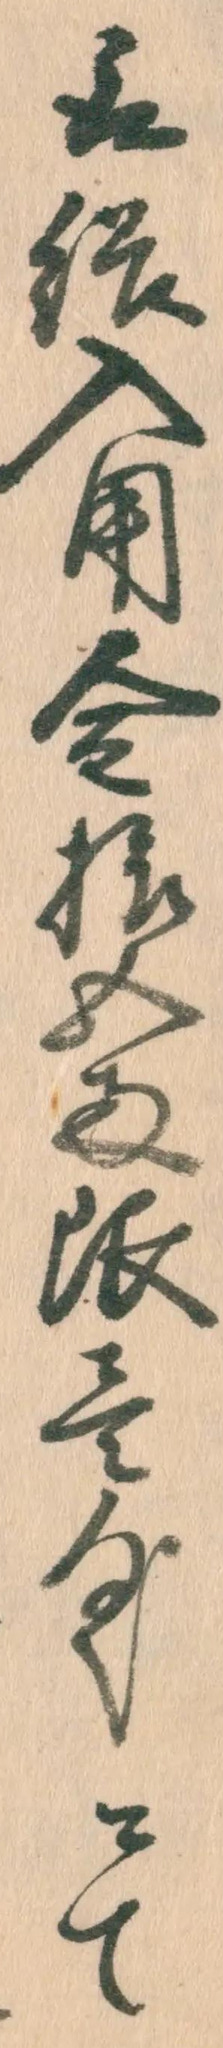取繕入用金拾五両銀壱匁にて
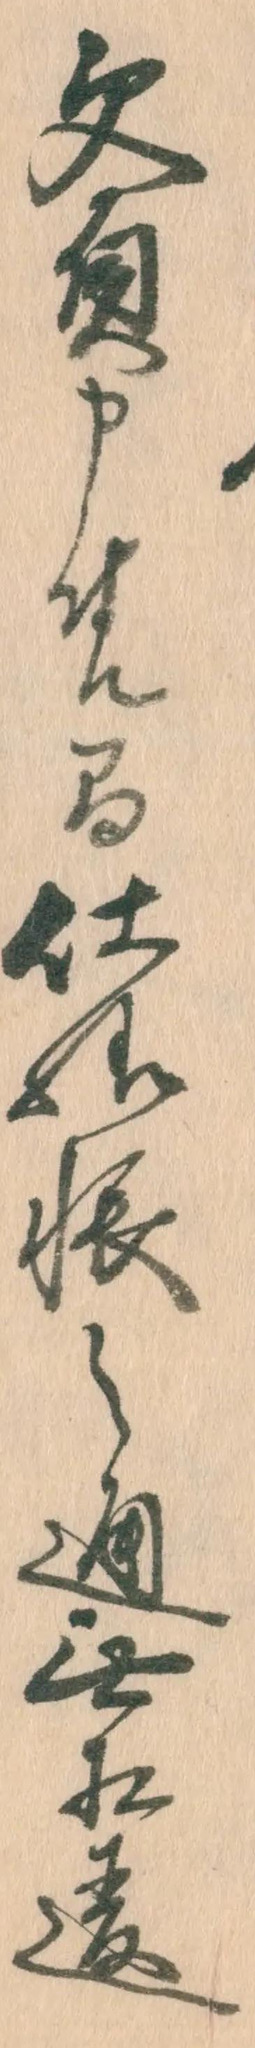受負申付候間仕様帳之通無相違

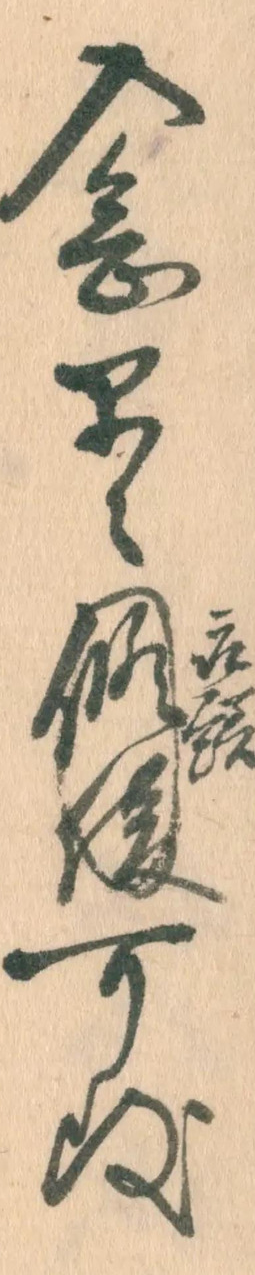入念早々取繕可致
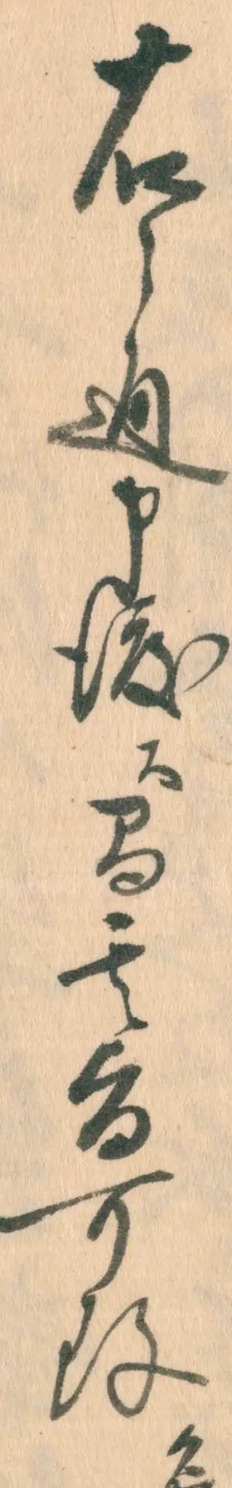右之通申渡候間其旨可致五人組
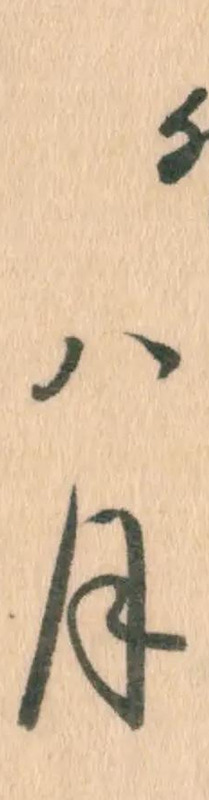卯八月
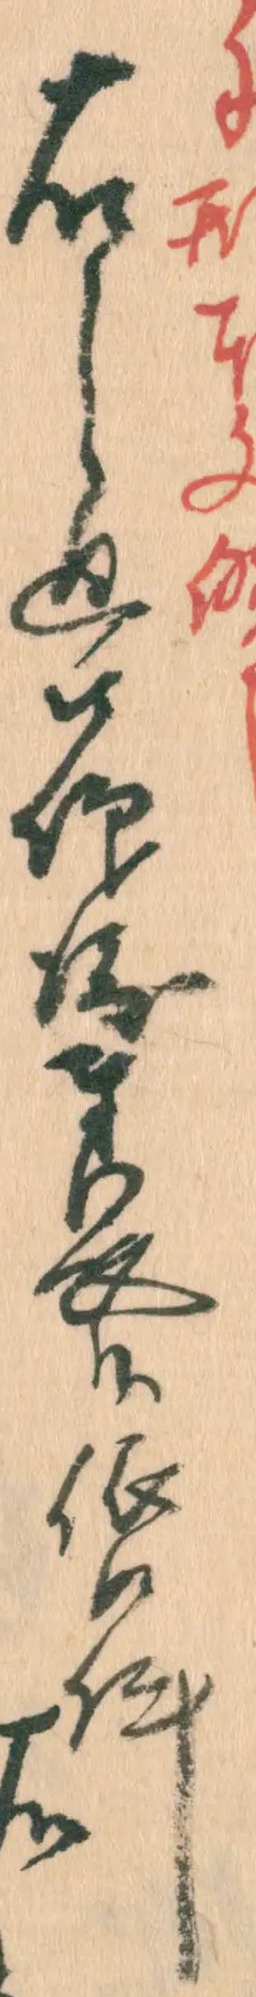右之通被仰渡奉畏候依如件
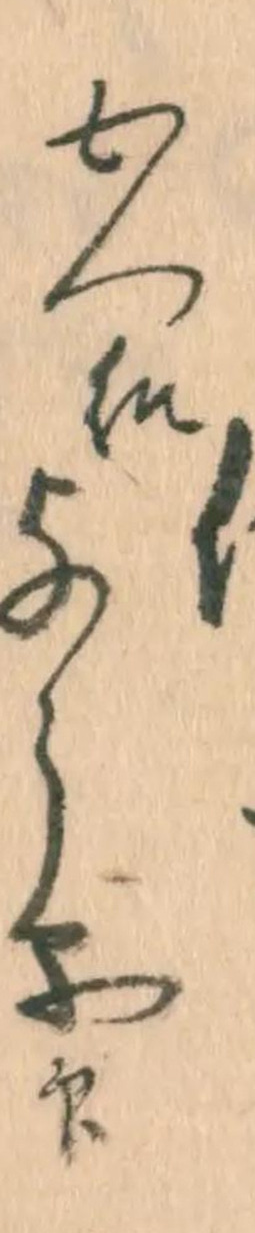五人組与兵衛印
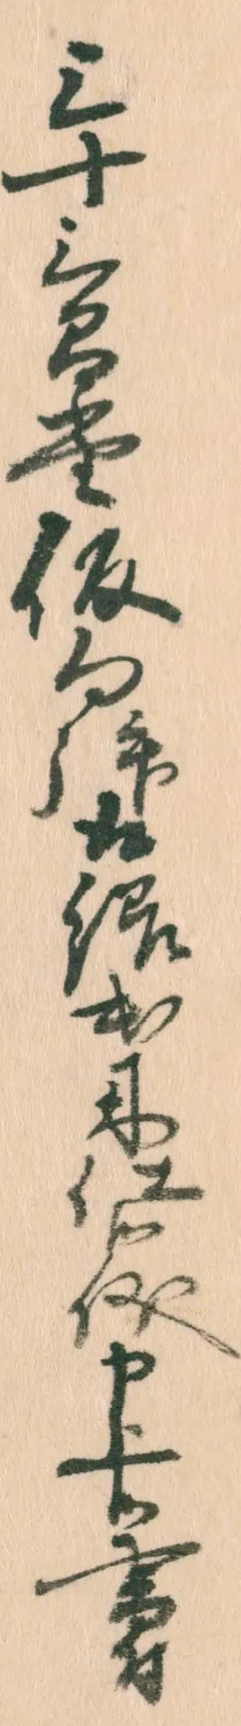三十三間堂仮向拝取繕出来仕候儀申上候書付
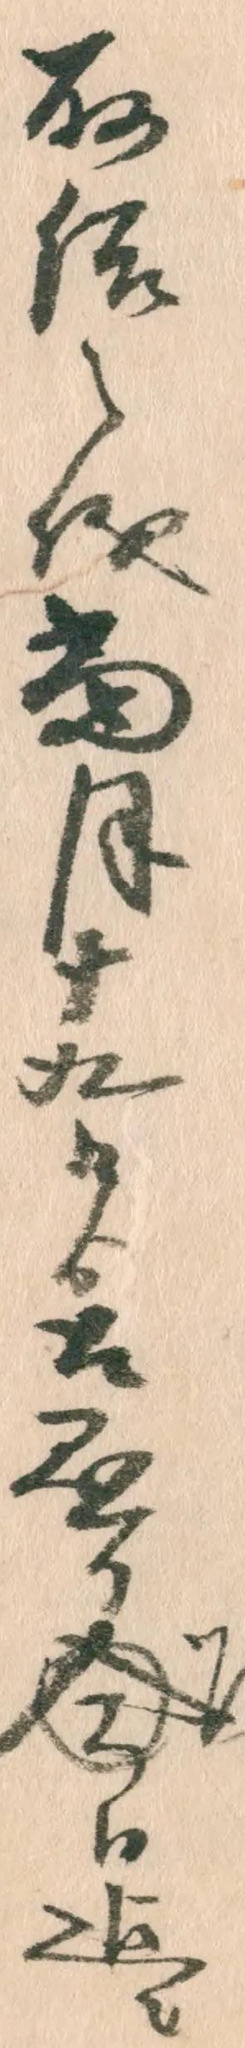取繕之儀当月十九日ゟ取懸り昨日迄に
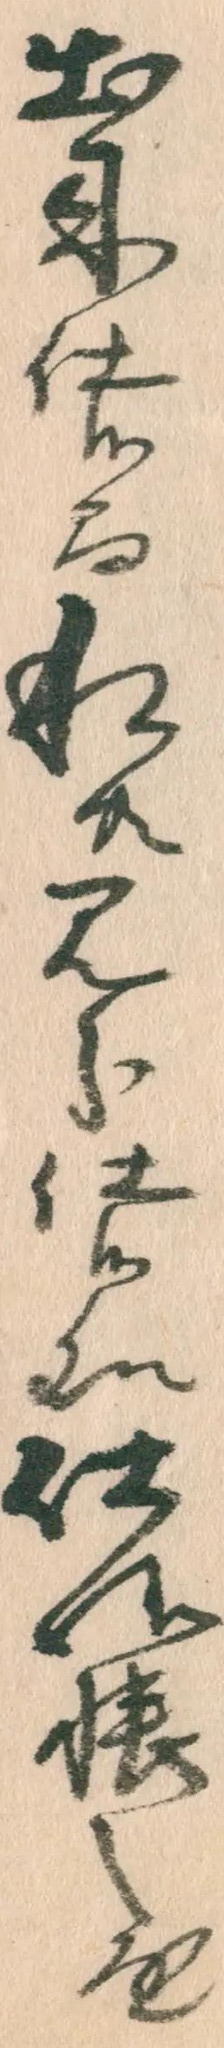出来仕候間私共見分仕候処仕様帳之通

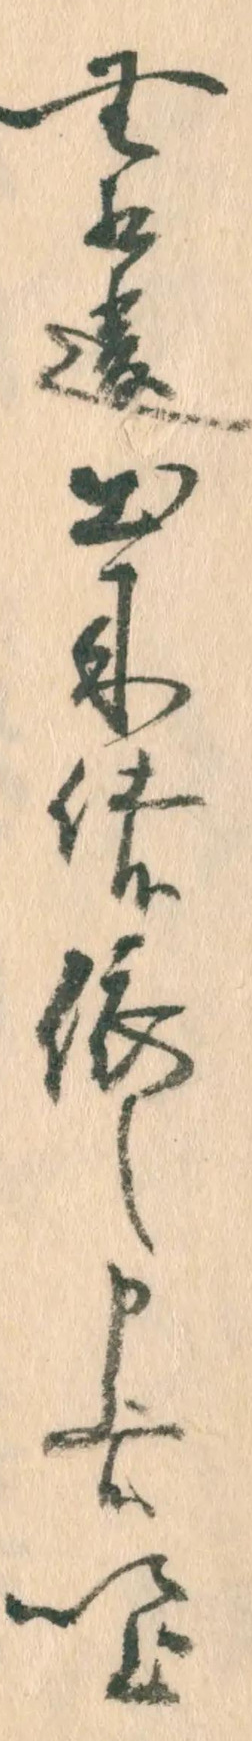無相違出来仕候依之申上候以上
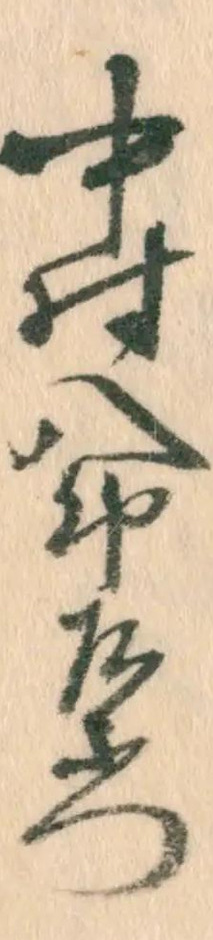中村八郎左衛門
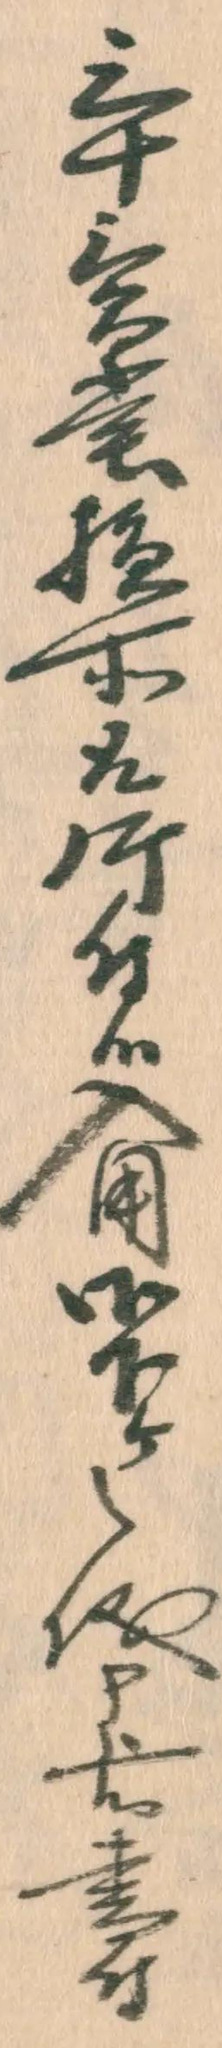三十三間堂損所取片付候入用御下ケ之儀申上候書付
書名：三十三間堂. [1]
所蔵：国立国会図書館 National Diet Library, JAPAN
